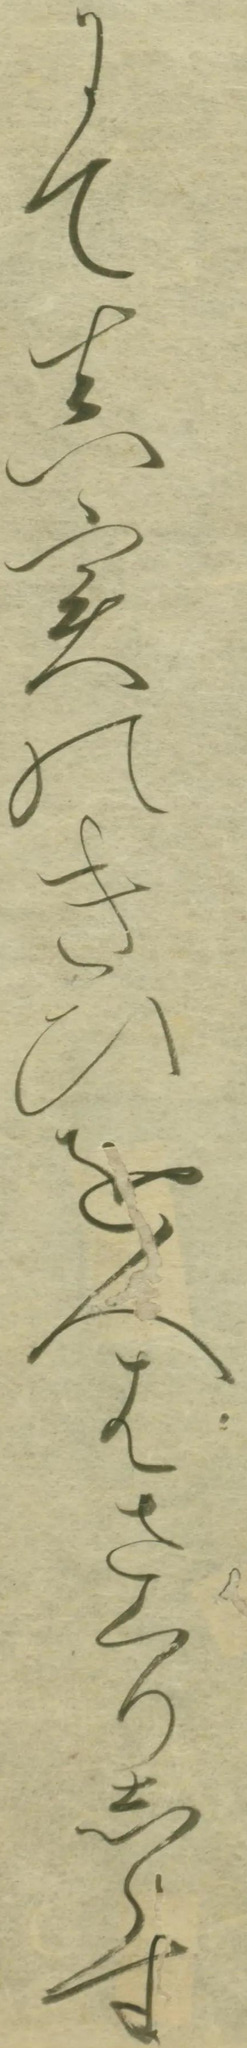にて真実のきひを人はさくりしらす
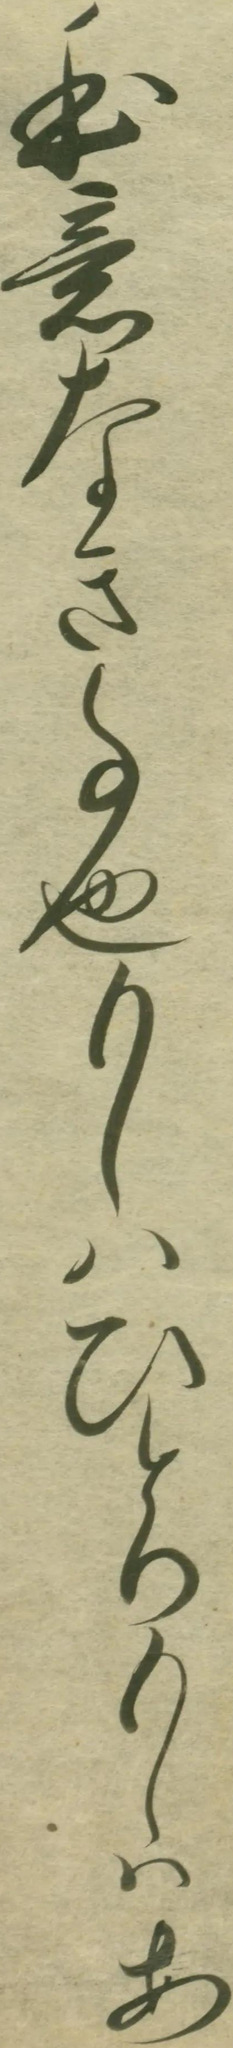本意なき事也もしはひとりもしはあ
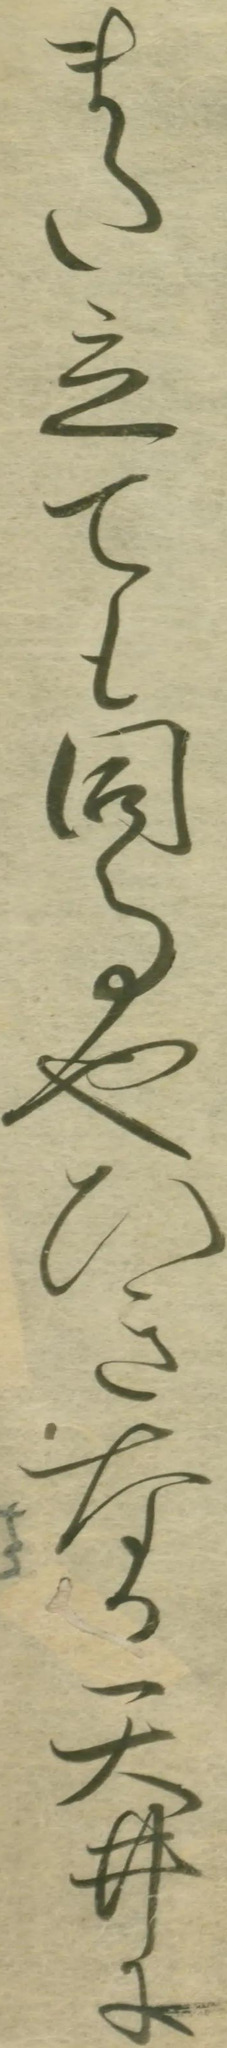また立ても同事也ひきなる天井に
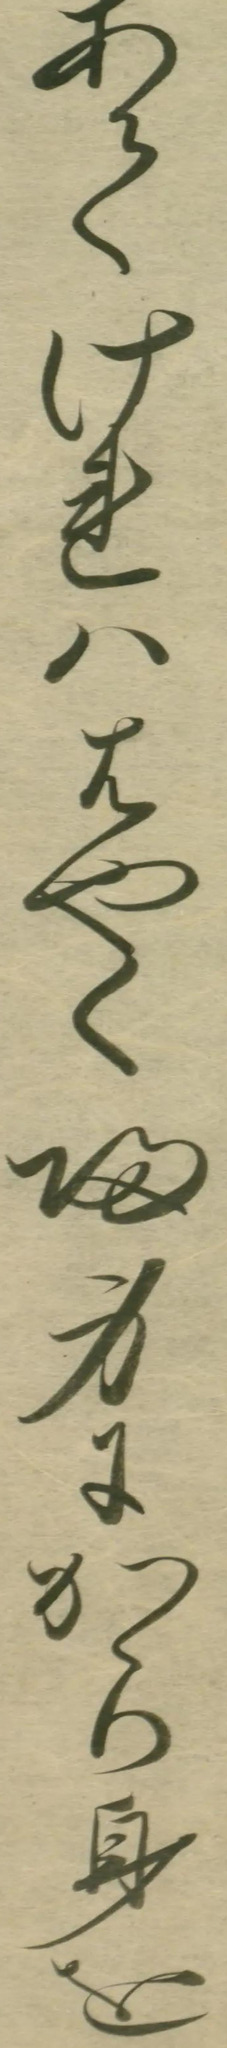あてけれははやく帰身にかゝり身を

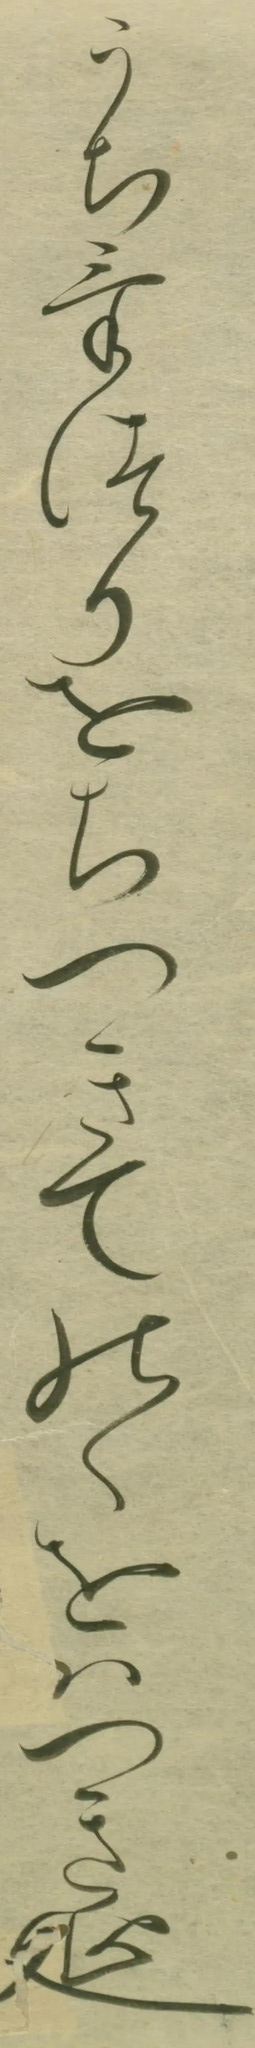うちけつりをちつきてのくをはつき延
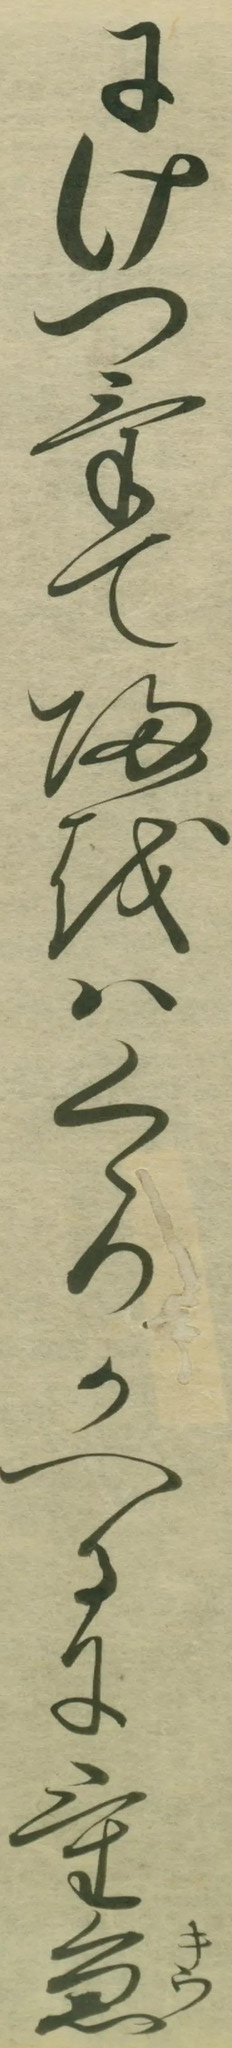にけつけて帰をはくゝりかへるにけ急
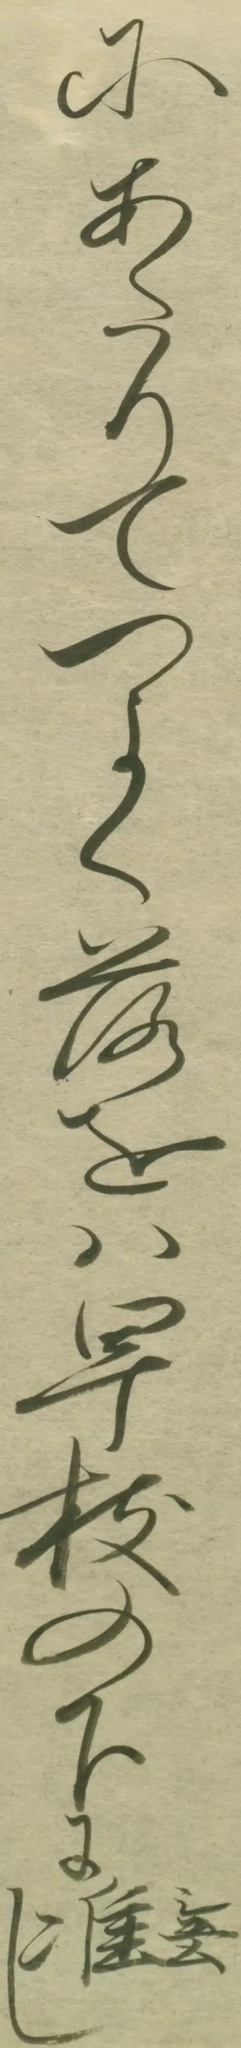にあたりてつよく落をは早枝の下に准し
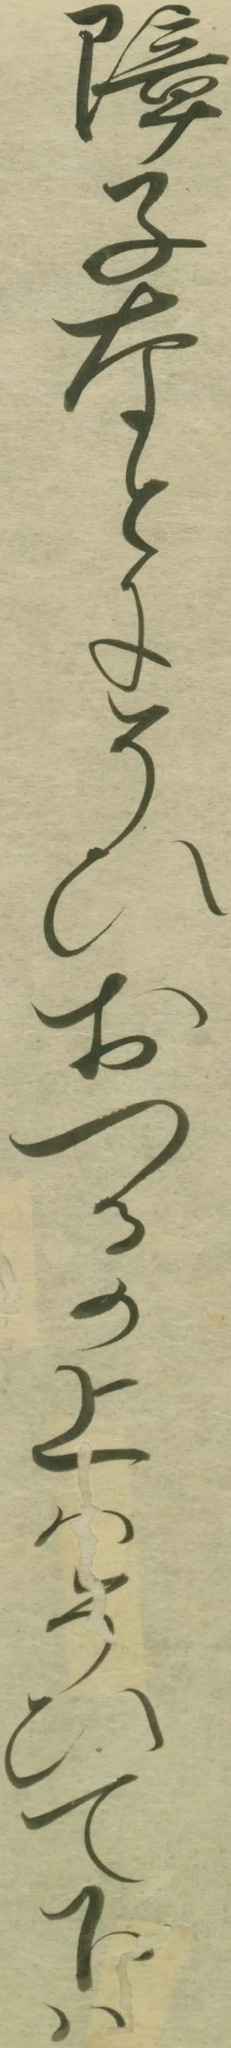障子なとにそひおつるの上はそひて下は
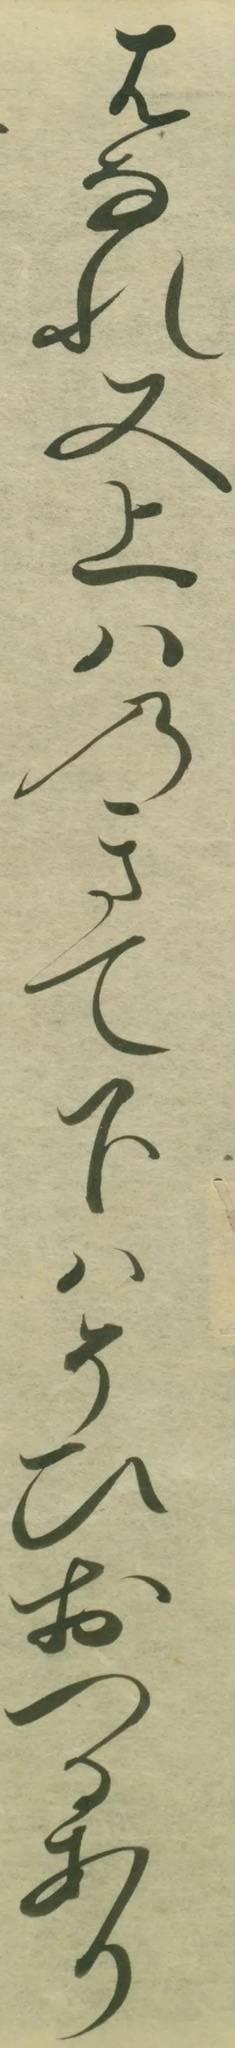はなれ又上はのきて下はそひおつるあり
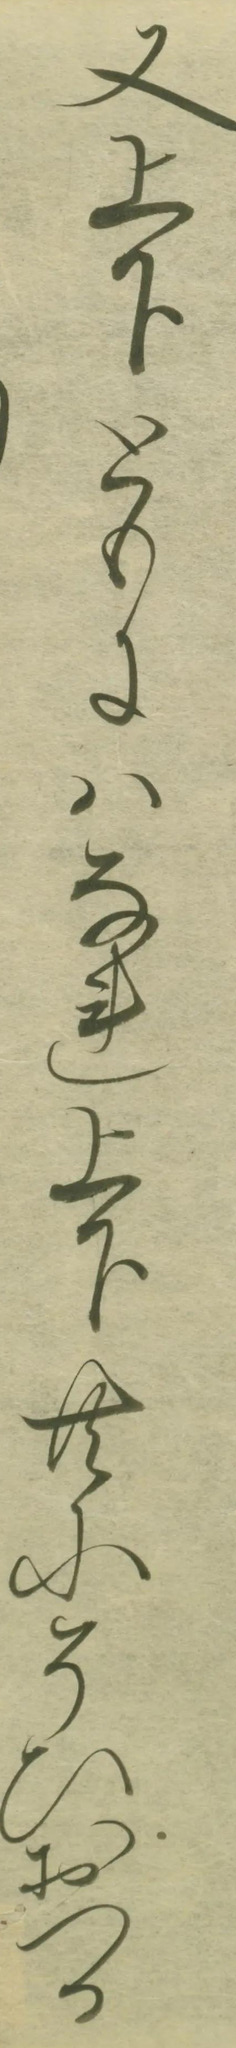又上下ともにはなれ上下共にそひおつる
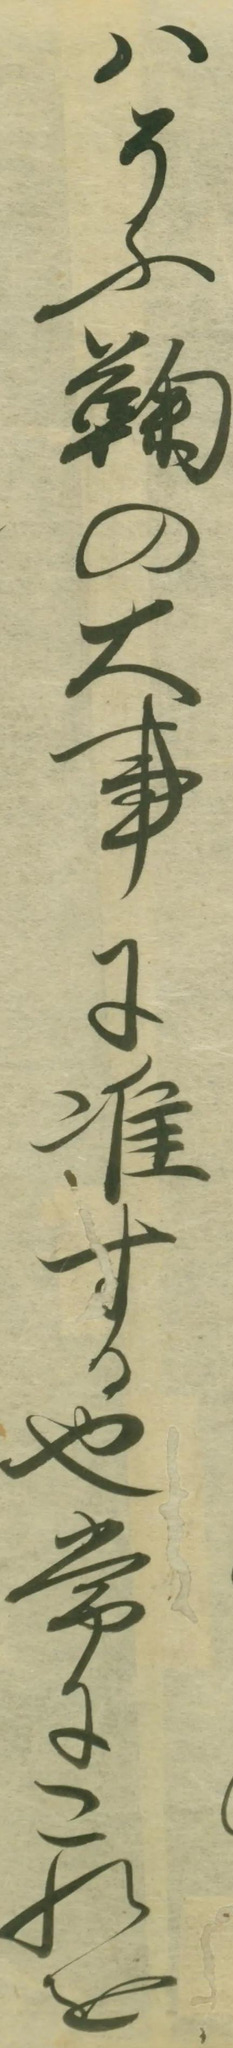はそふ鞠の大事に准する也常にこれを
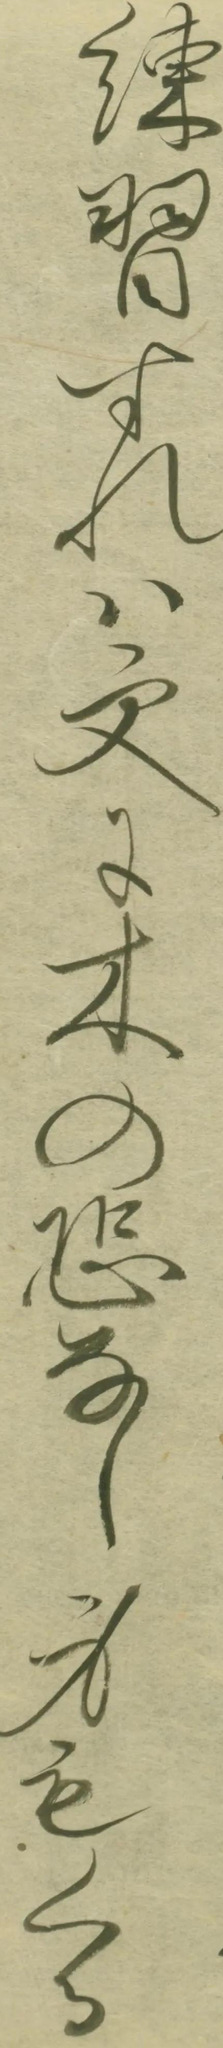練習すれは更に木の恐なし身もくる
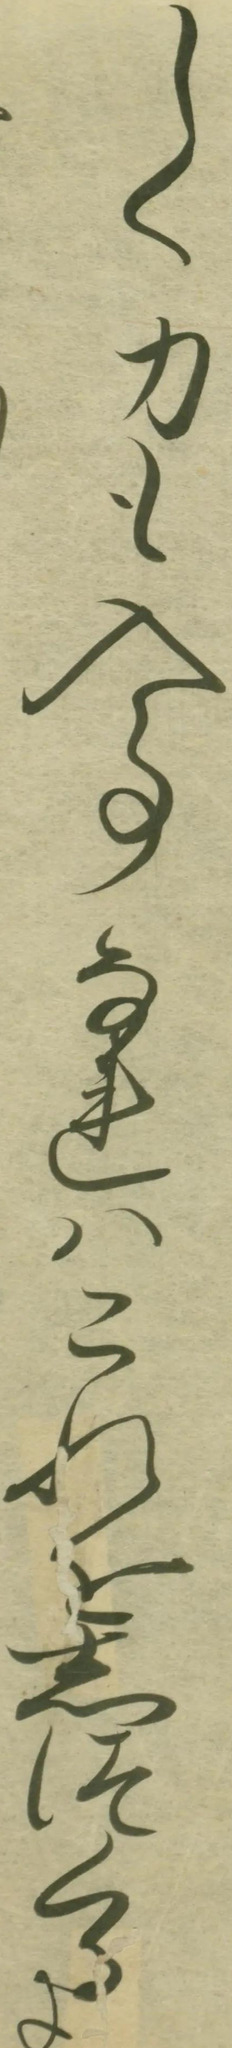しく力も入事なれはこれをしつくるに
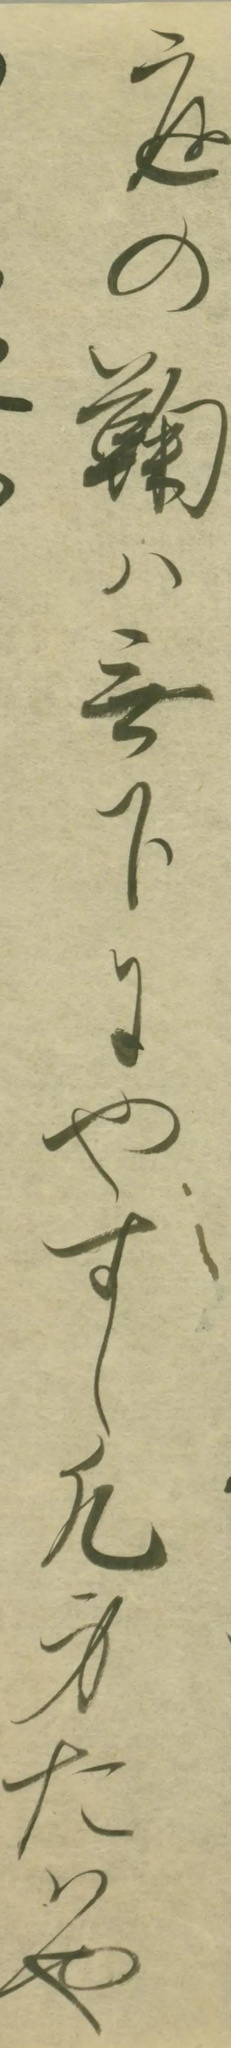庭の鞠は無下にやすし凡身たはや
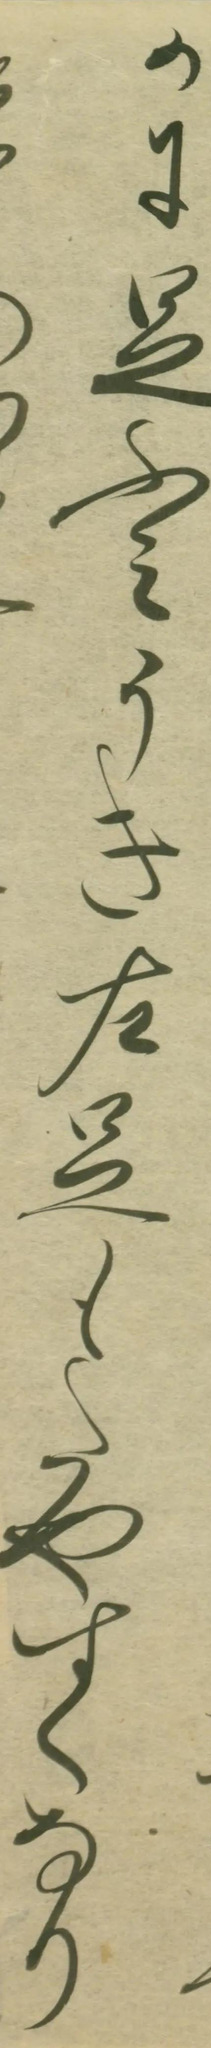かに足ふみうき左足もたやすくなり
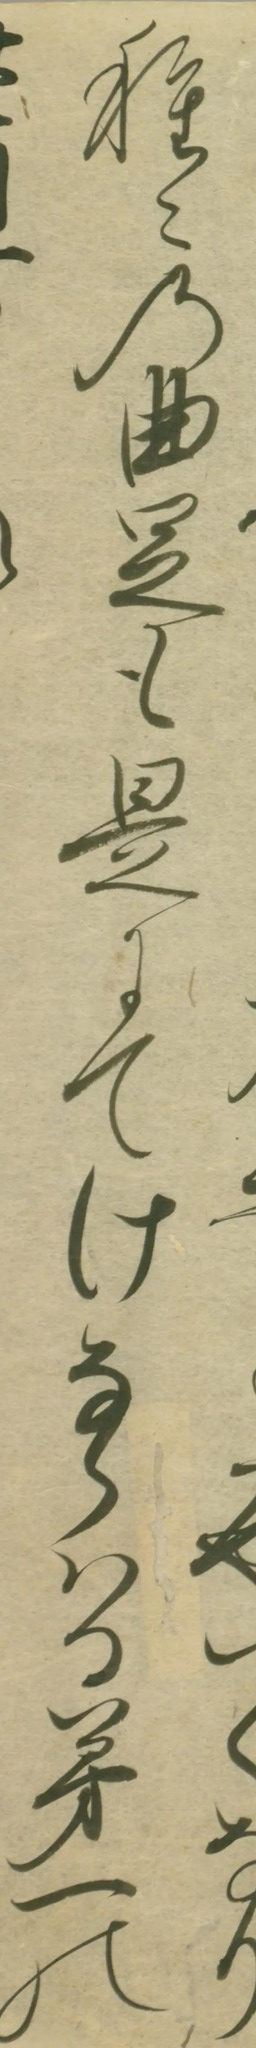種々の曲足も是にてけならはる第一の
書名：蹴鞠之条々大概
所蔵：国立国会図書館 National Diet Library, JAPAN
